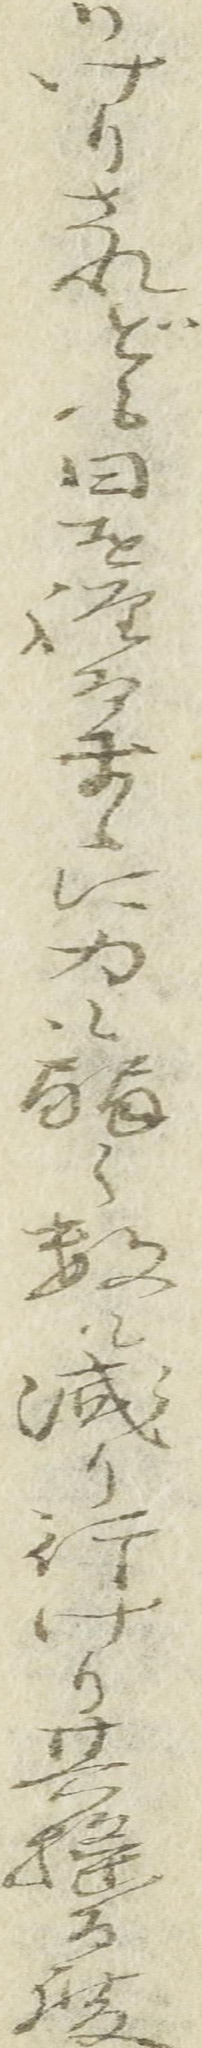りけりされども日を経るまゝに力も弱く数も減り行けり其揺る度
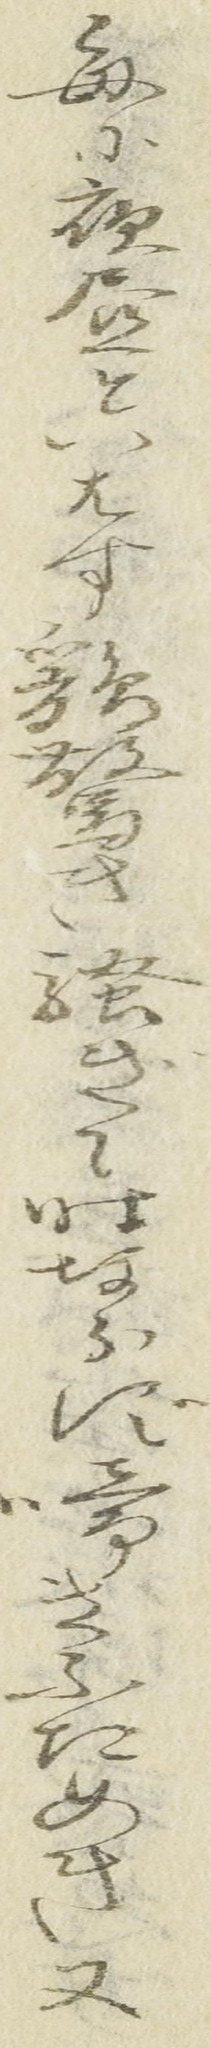毎に夜昼といはす鶏驚き騒ぎて時ならず啼きふためき又
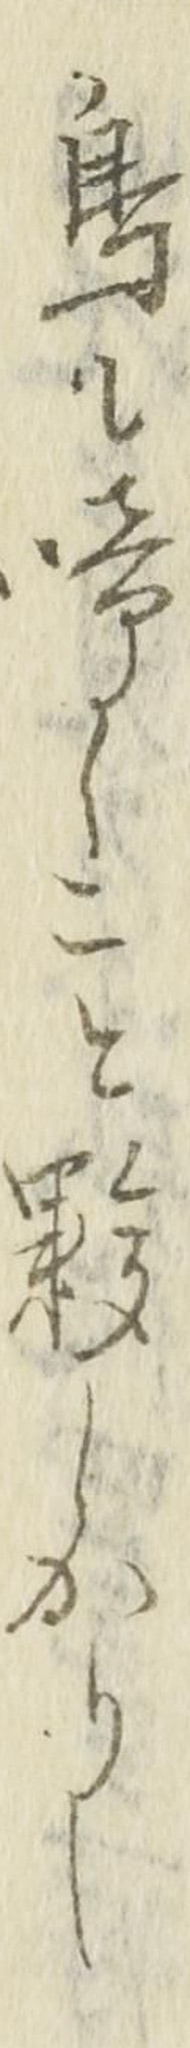鳥も啼くこと夥しかりし
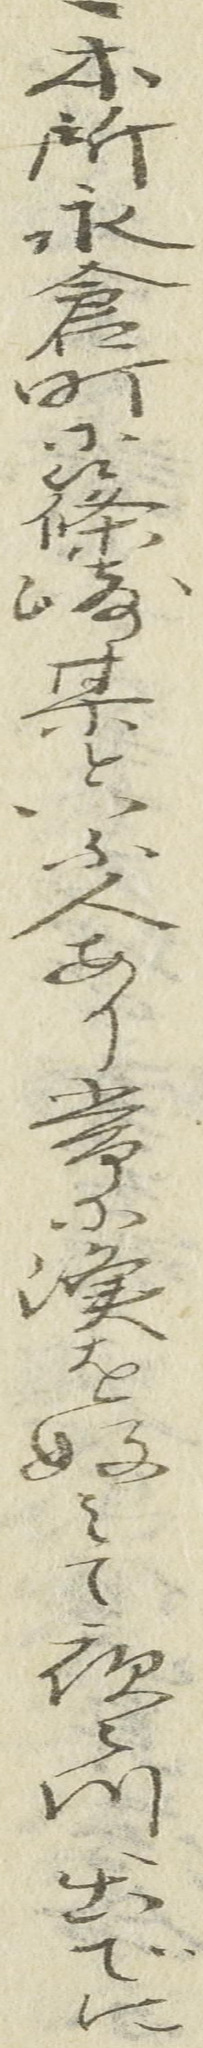一本所永倉町に篠崎某といふ人あり常に漁を好みて夜々川出でに
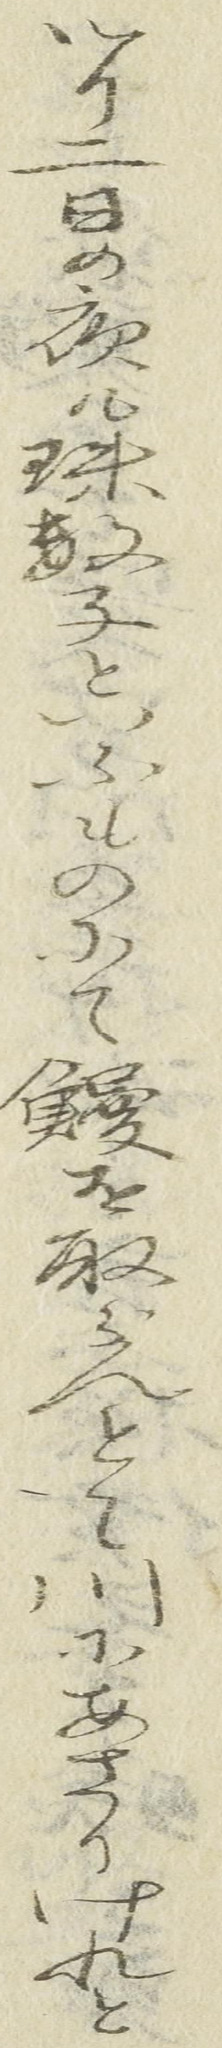けり二日の夜も珠数子といふものにて鰻を取らんとて川にあさりけれと
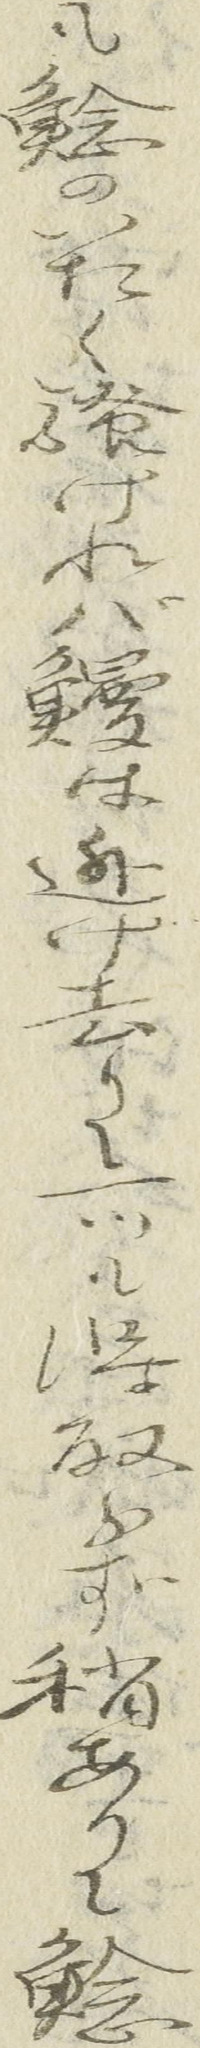も鯰のいたく騒ければ鰻は逃げ去りて一つも得取らず稍ありて鯰
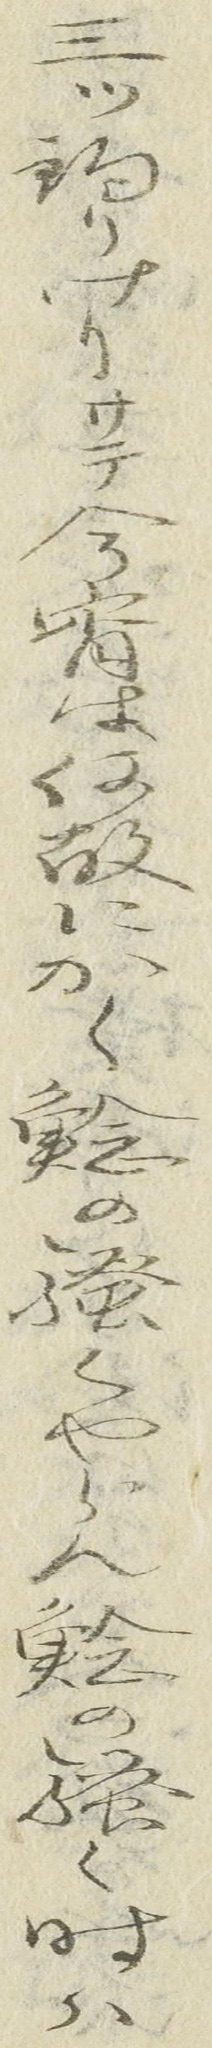三ツ釣りけりサテ今宵は何故にかく鯰の騒くやらん鯰の騒く時は
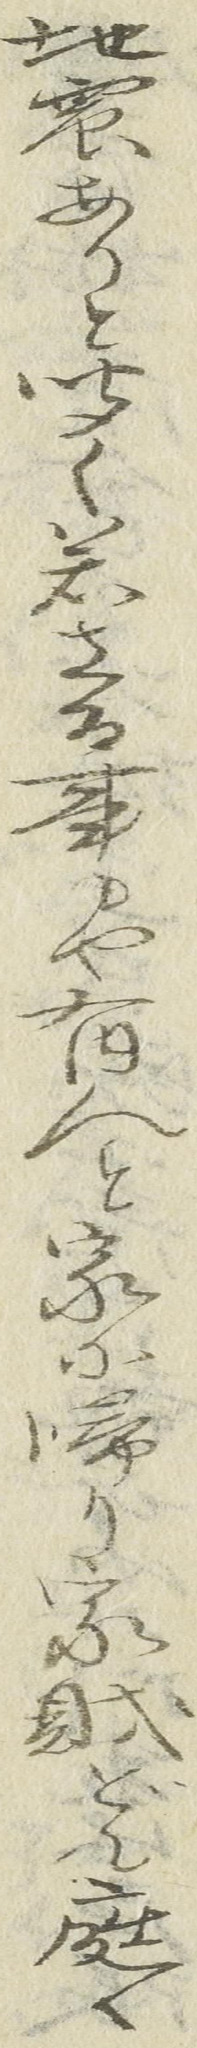地震ありと聞く若さる事もや有んと家に帰り家財ども庭へ
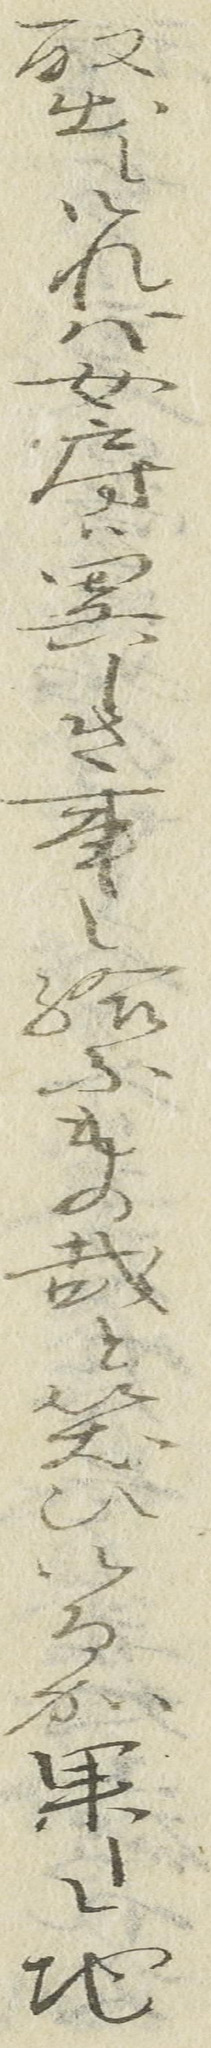取出しければ女房は異しき事し給ふもの哉と笑ひけるが果して地
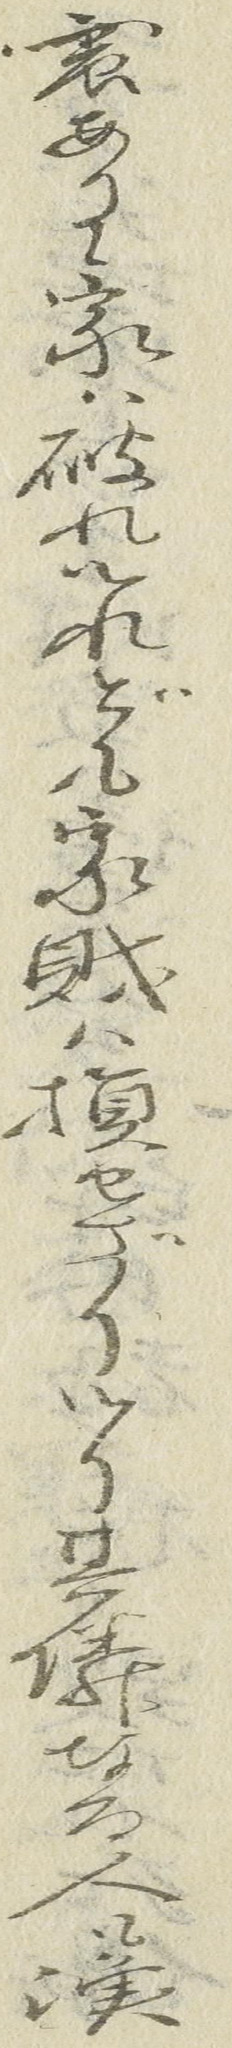震ありて家は破れけれども家財は損せざりけり其隣なる人も漁
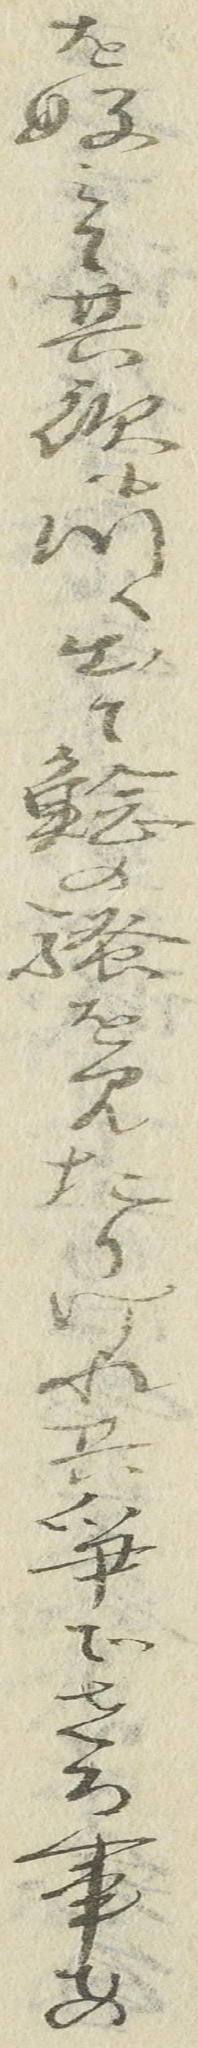を好みて其夜も川へ出て鯰の騒を見たりけれ共争でさる事あ
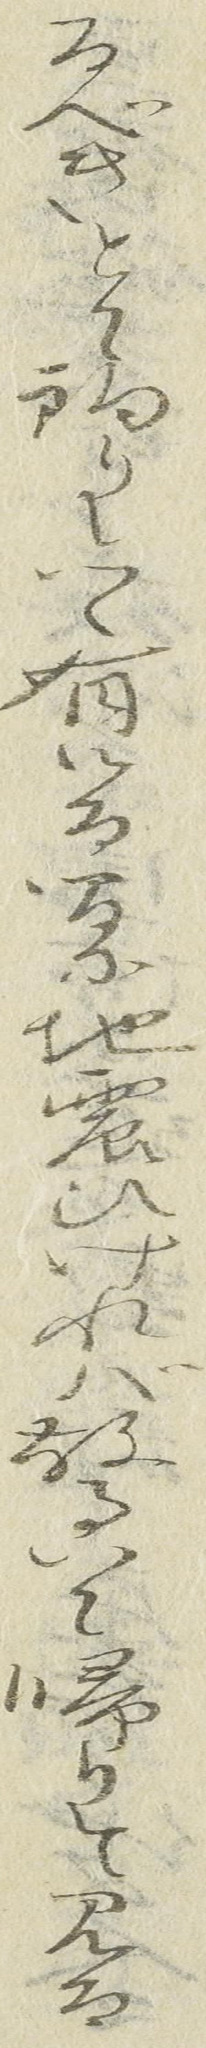るべきとて釣りしつゝ有ける間に地震ひければ驚いて帰りて見る
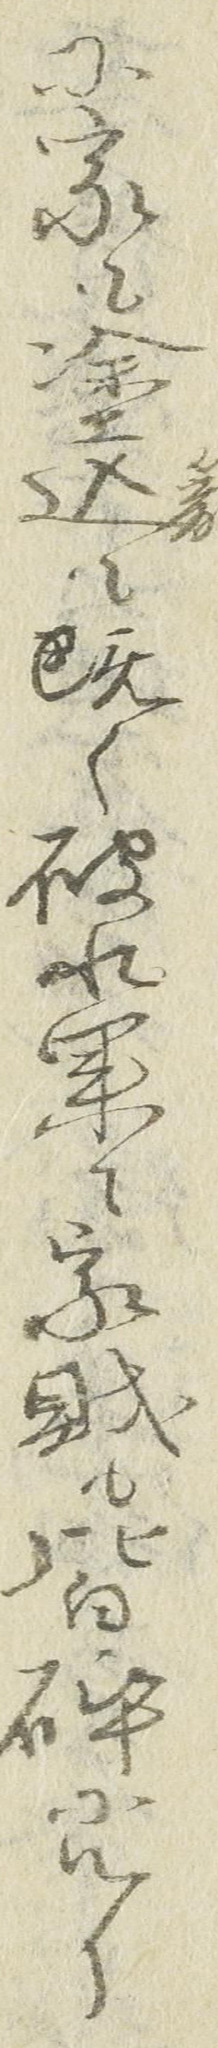に家も塗込も既く破れ果て家財も皆砕にけり
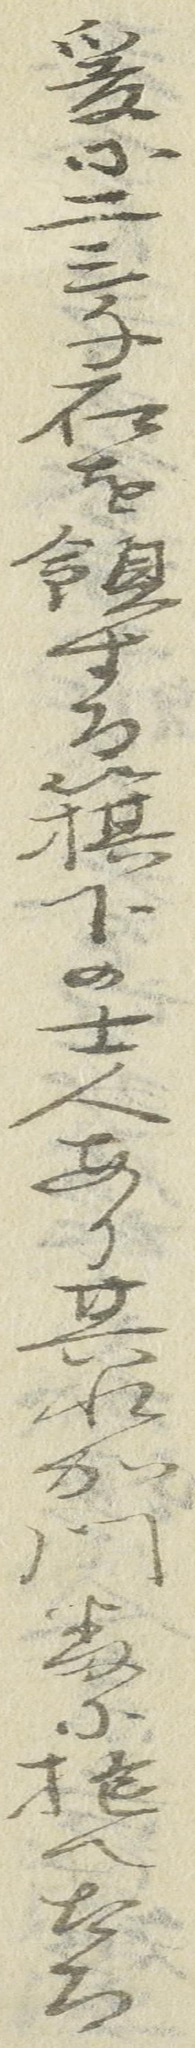一爰に二三千石を領する旗下の士人あり其れが門番に抱へたる

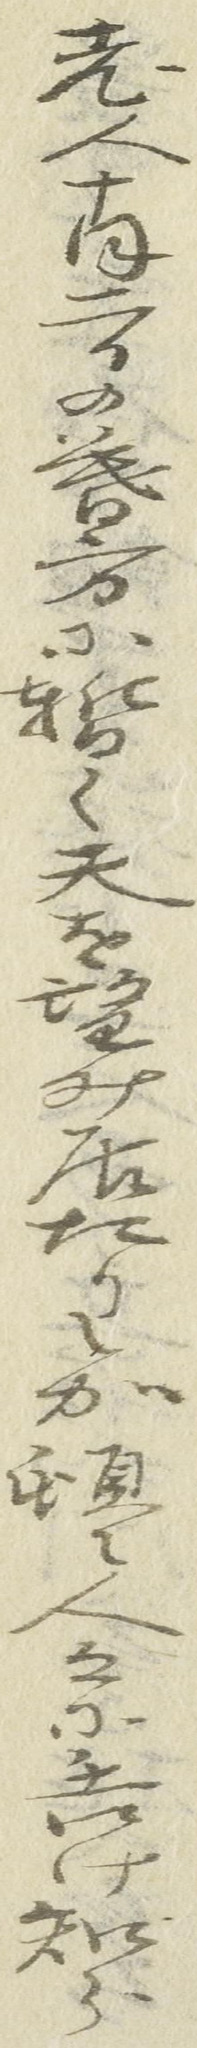老人十月二日の暮方に暫く天を望み居たりしが頓て人々に告げ知ら
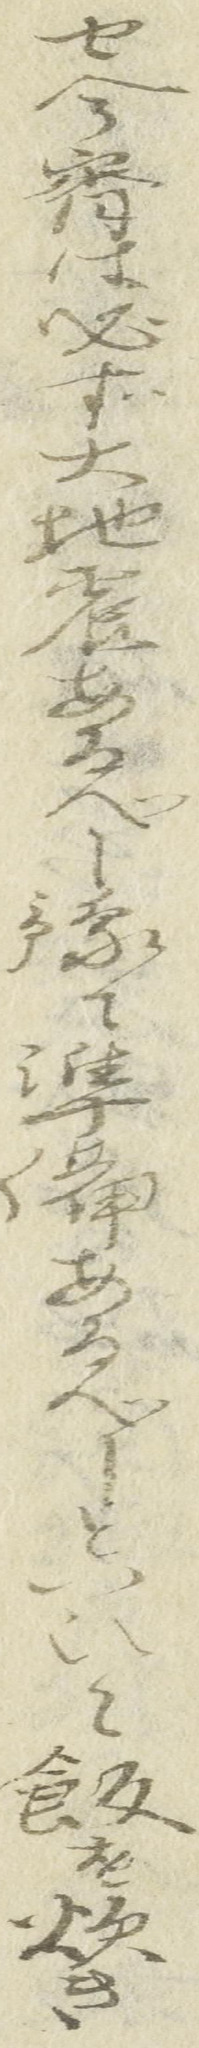せ今宵は必ず大地震あるべし豫て準備あるべしといひて飯を炊き
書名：地震前兆集　全
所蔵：東京大学地震研究所図書室 Earthquake Research Institute Library, The University of Tokyo, JAPAN
